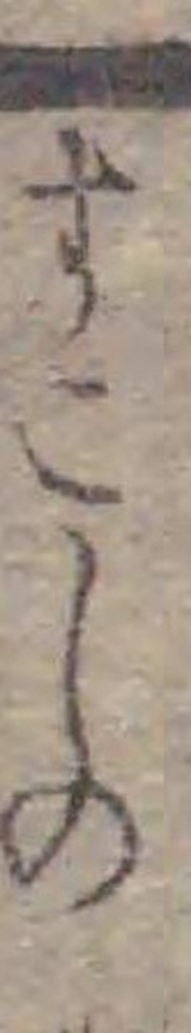すこしの
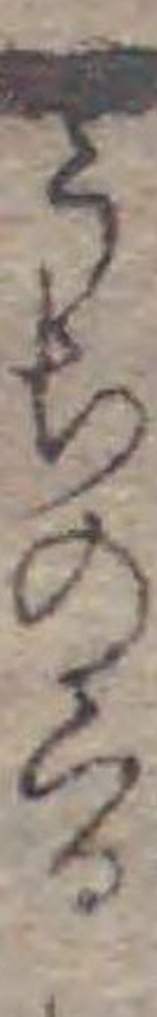うちのくる
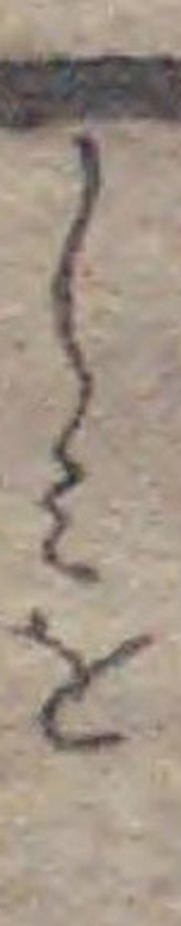しみを
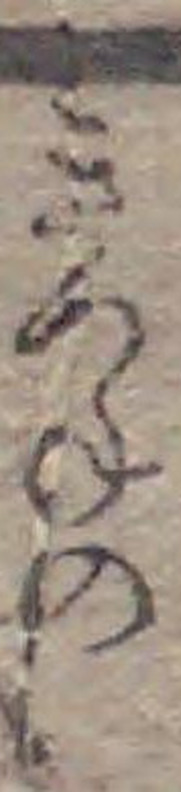きつねの
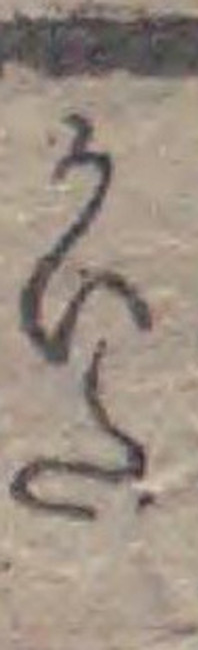かいた
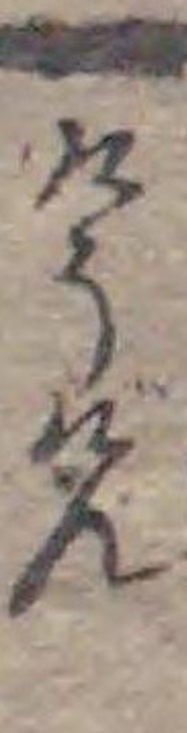けうげん
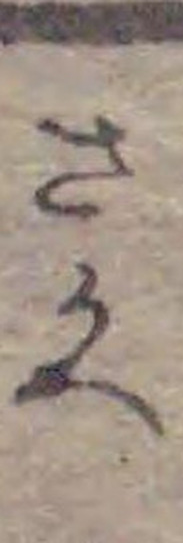さかへ

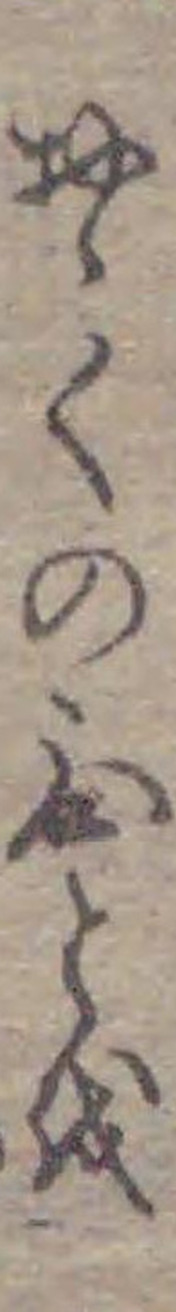おゝくのひとを
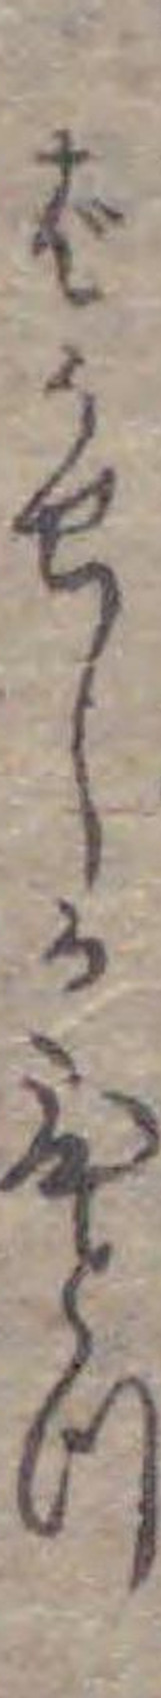ばかせしかひとつ
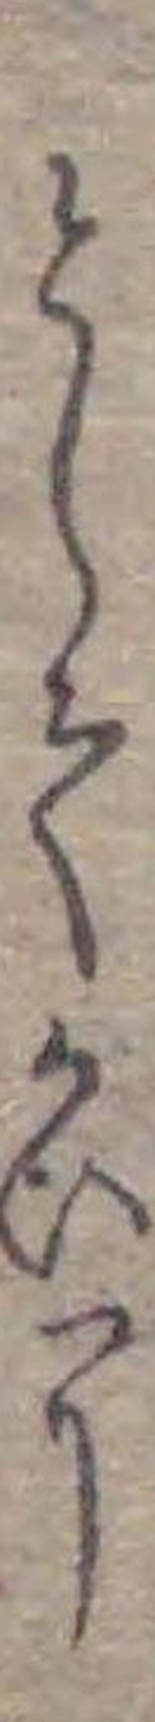としてかいに
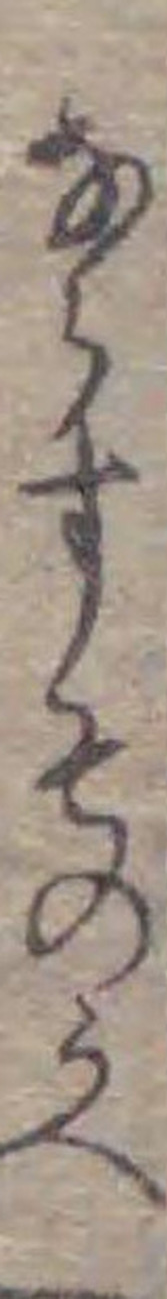ならすそのうへ
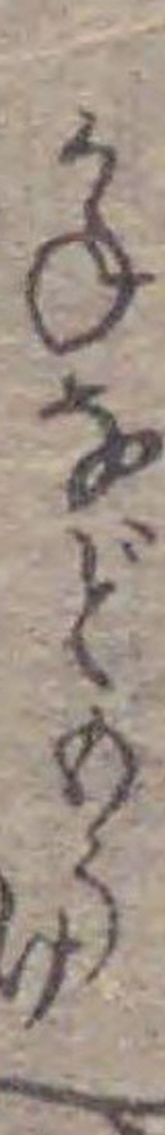かねなどもうけ
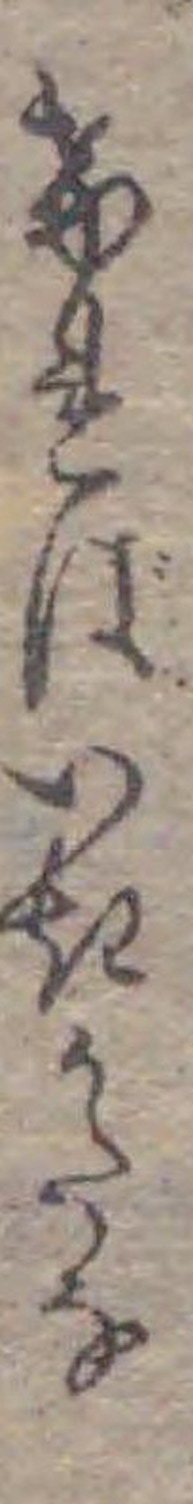ければいきかたな
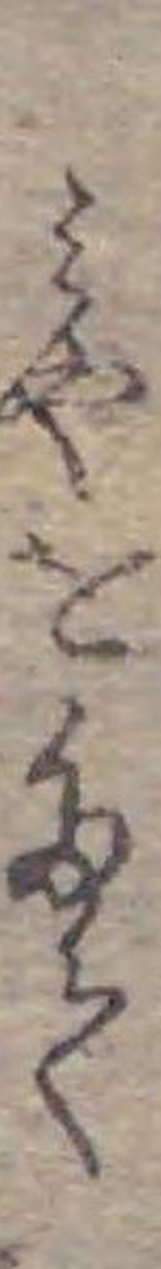みやをたて
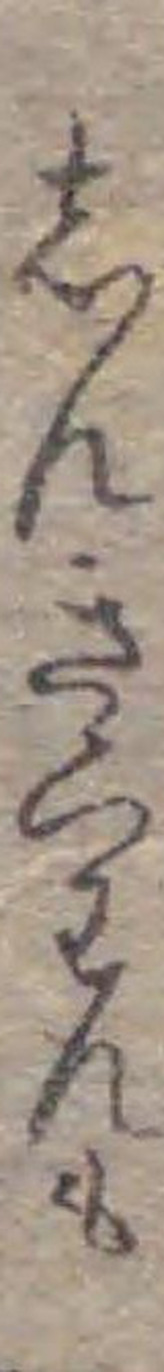しんきくわんも
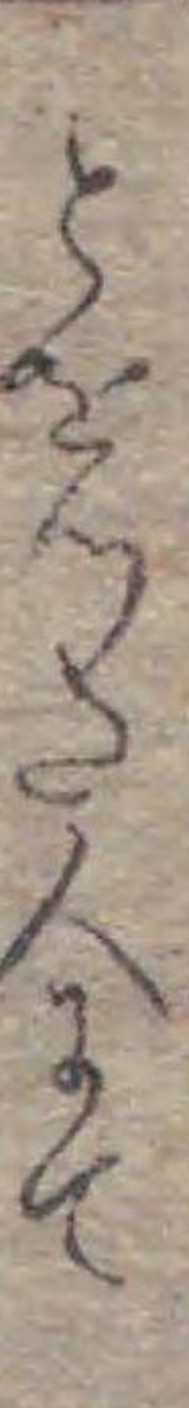とをつた人にて
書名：紺屋百物語 : 3巻
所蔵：国立国会図書館 National Diet Library, JAPAN
